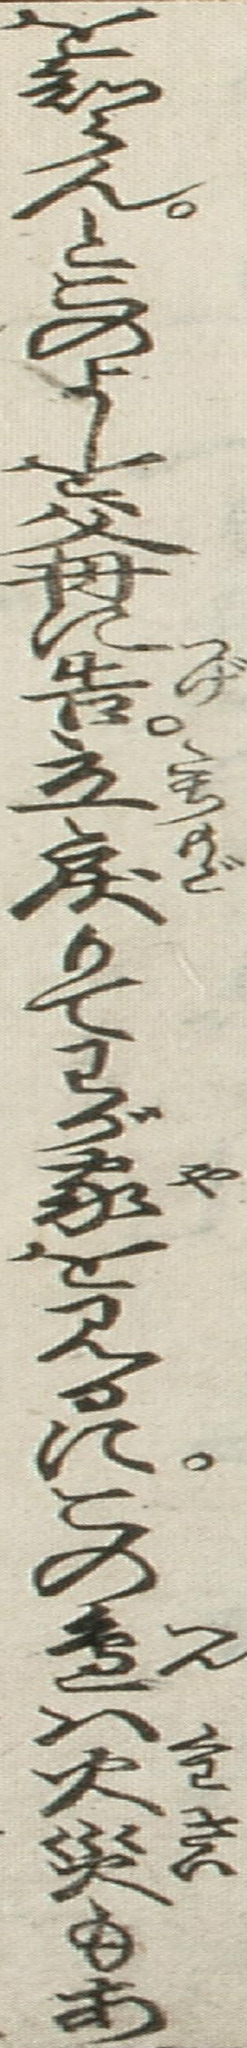を知らん。とこのよしを父母に告。立戻りてわが家を見るに。この辺は火災もあ
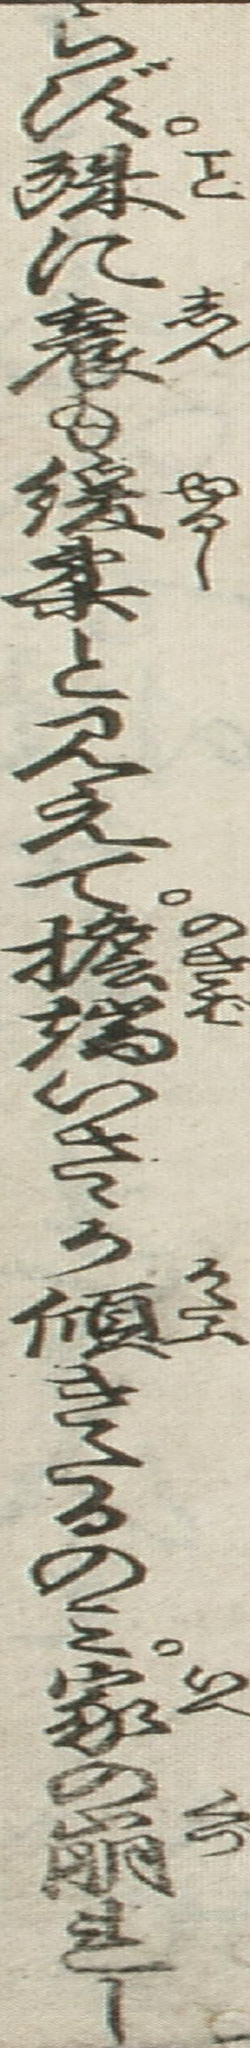らず。殊に震も緩柔と見えて。檐場いさゝか傾きたるのみ。家の崩れし
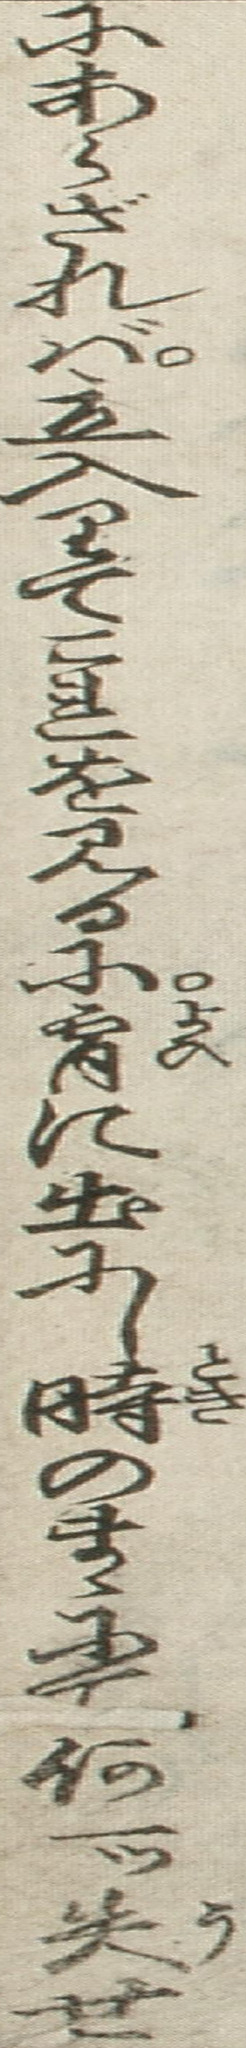にあらざれば。立ち入りてこれを見るに。宵に出にし時のまゝにて何一ッ失せ

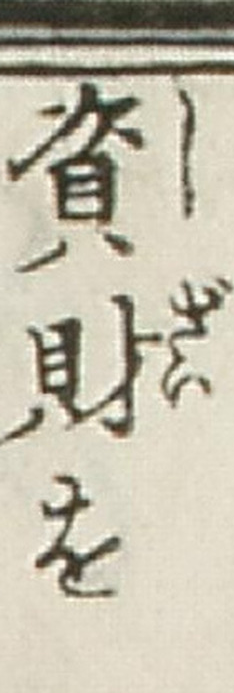資財を

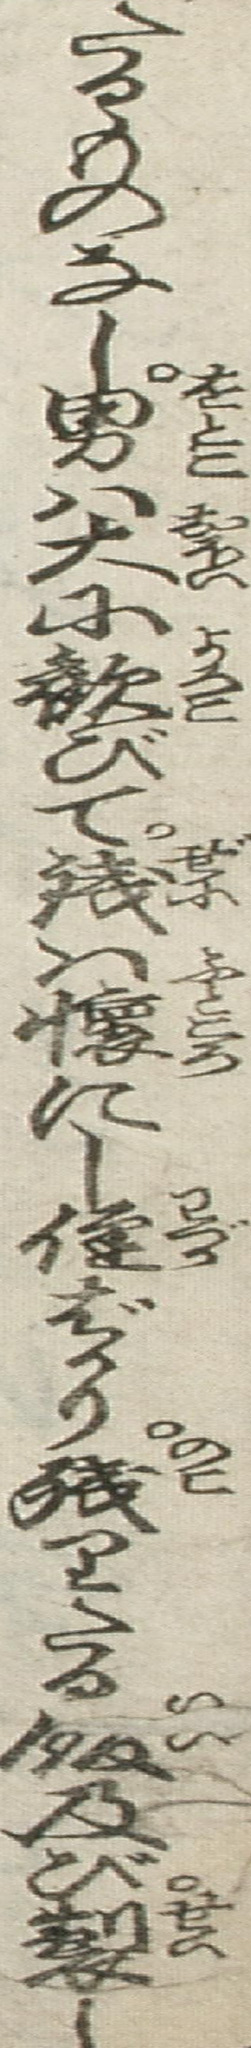たるものなし。男は大に歓びて。銭は懐にし僅ばかり。残りたる飯及び。製し
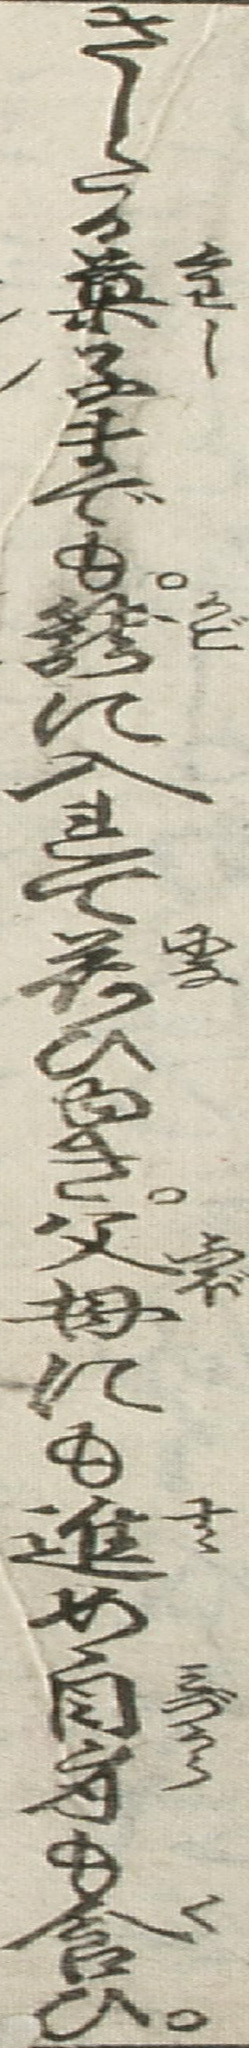さしたる菓子までも。籠に入れて荷ひゆき。父母にも進め自身も食ひ。
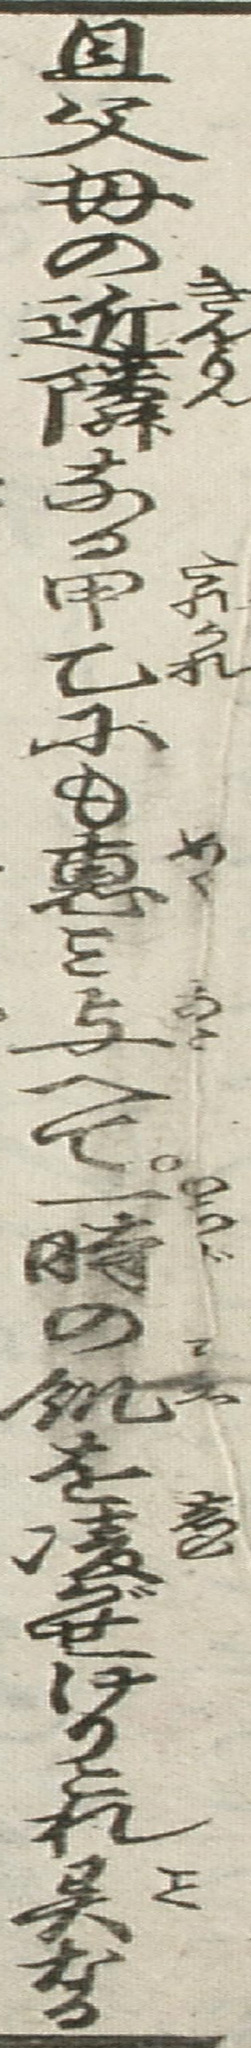且父母の近隣なる甲乙にも恵み与へて。一時の飢を凌がせけりこれ異なる
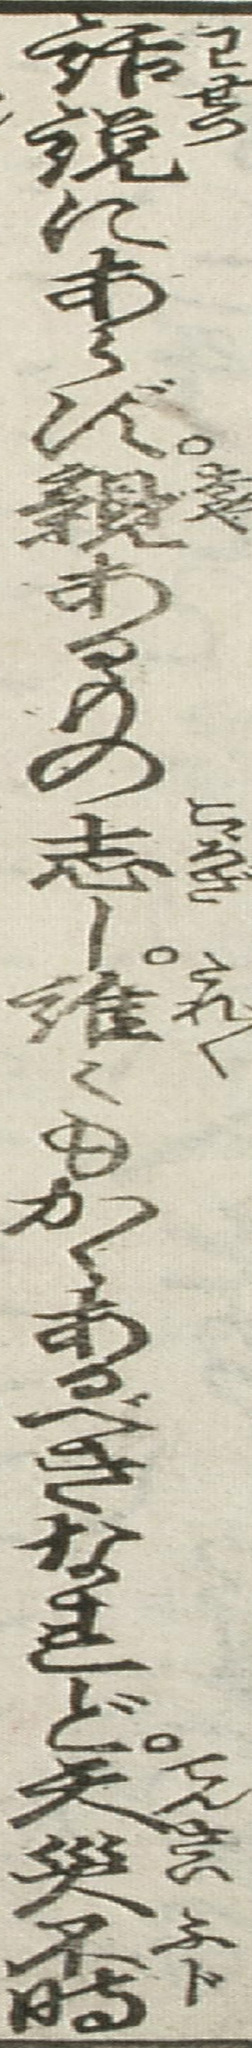話説にあらず。親あるもの志し。誰〻もかくあるべきなれど。天災不時
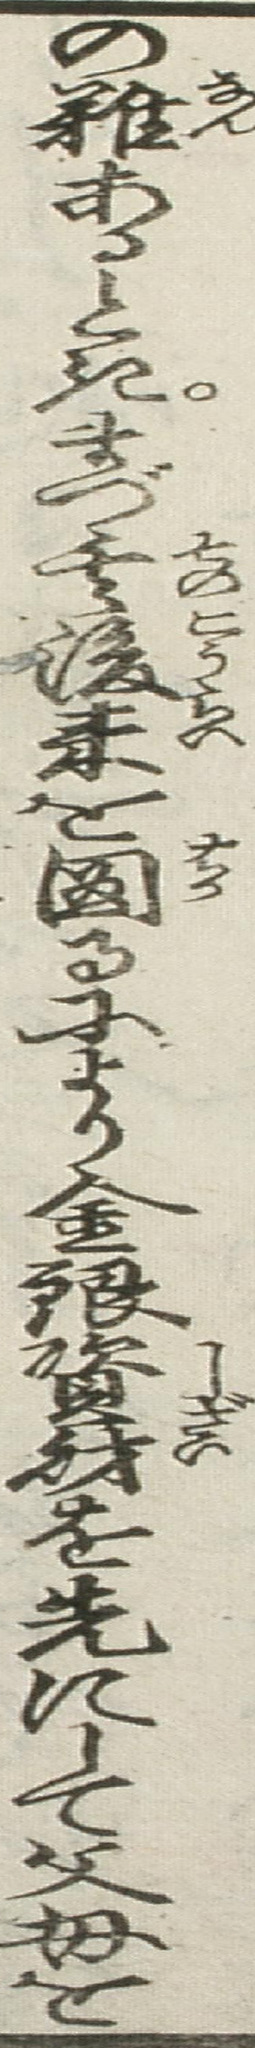の難あるとき。まづ其後来を図るにより金銀資財を先にして父母を
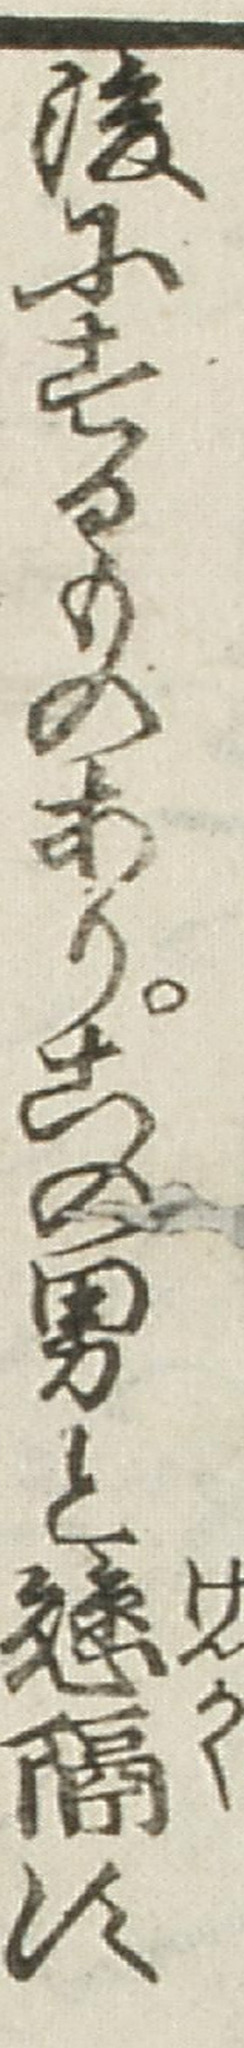後にするものあり。この男と懸隔す
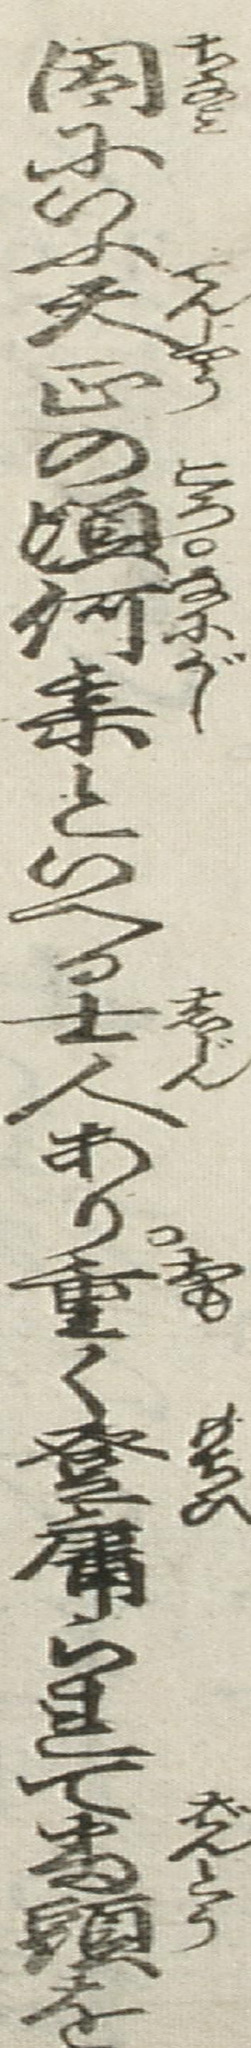因にいふ天正の頃。何某といへる士人あり。重く登庸られて番頭を
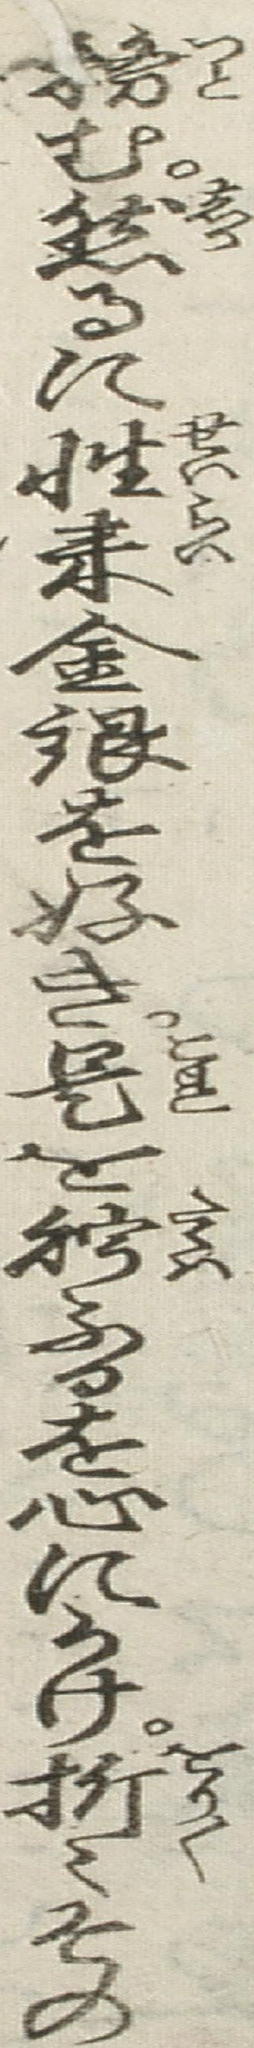務む。然るに性来金銀を好き。是を貯ふるを心にかけ。折〻その
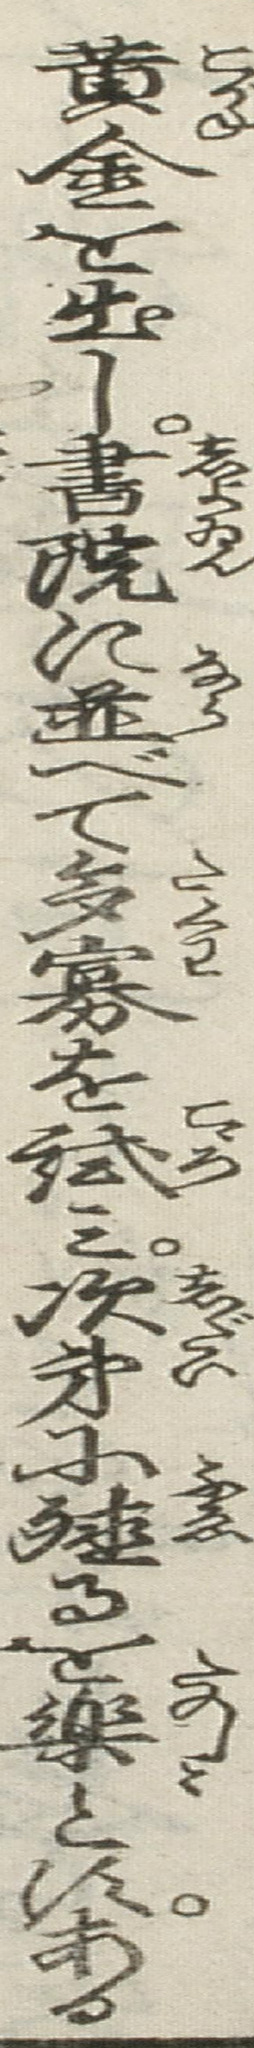黄金を出し。書院に並べて多寡を試み。次第に殖るを楽とす。ある
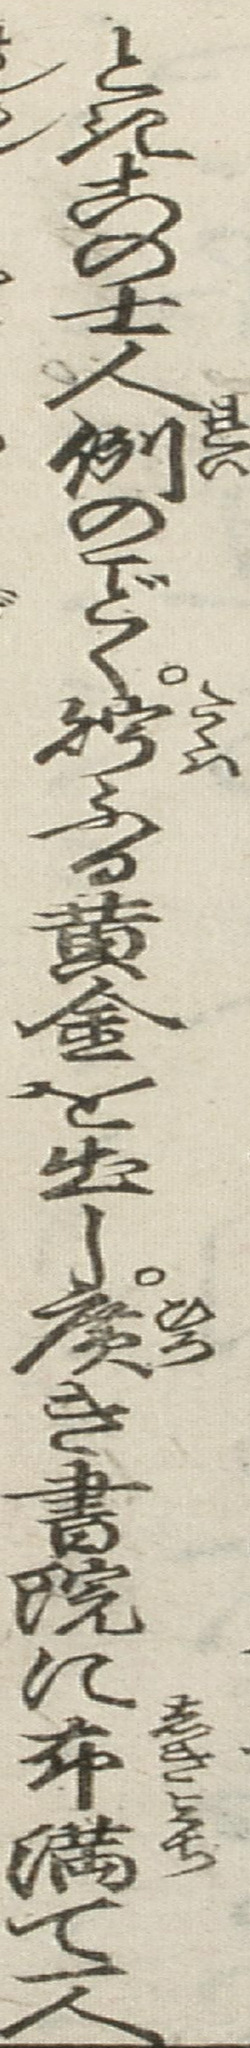ときこの士人例のごとく。貯ふる黄金を出し。広き書院に布満て一人
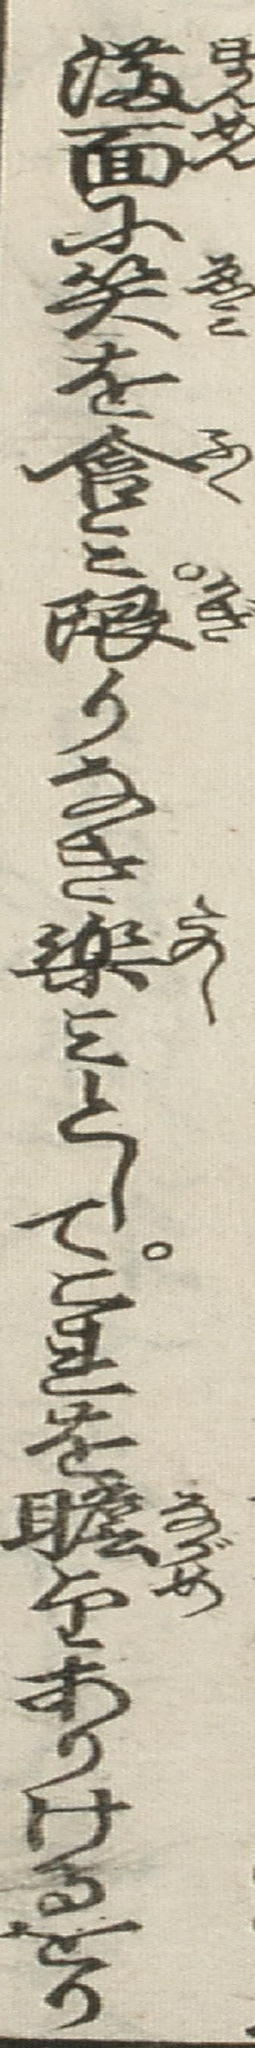満面に笑を含み。限りなき楽みとして。これを瞻望ありけるをり
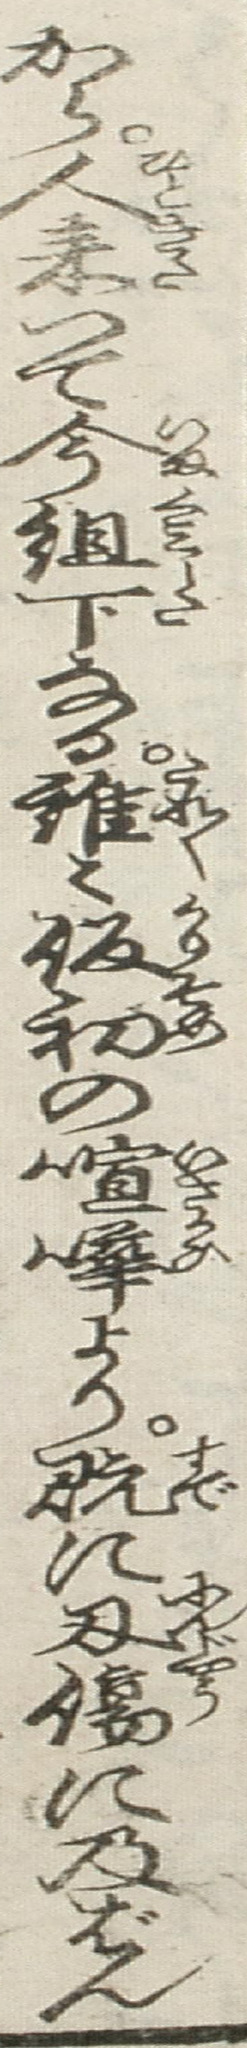から。人来つて今組下なる。誰〻仮初の喧嘩より。既に刃傷に及ばん
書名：安政見聞録　下
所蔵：東京大学地震研究所図書室 Earthquake Research Institute Library, The University of Tokyo, JAPAN
